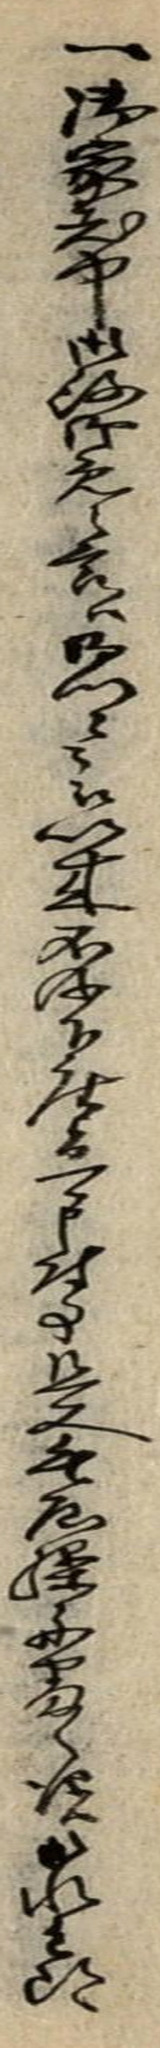一御家老中御役御免之節は御門〳〵江以来不及下座旨可申付事且又毛屋繰舟番之儀は御水主頭へ
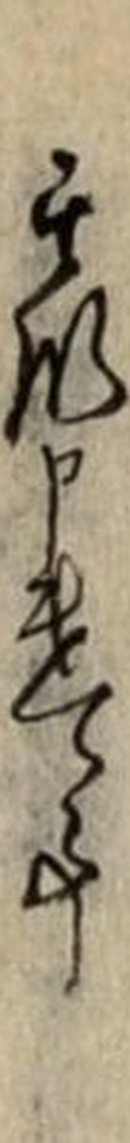其段申遣候事
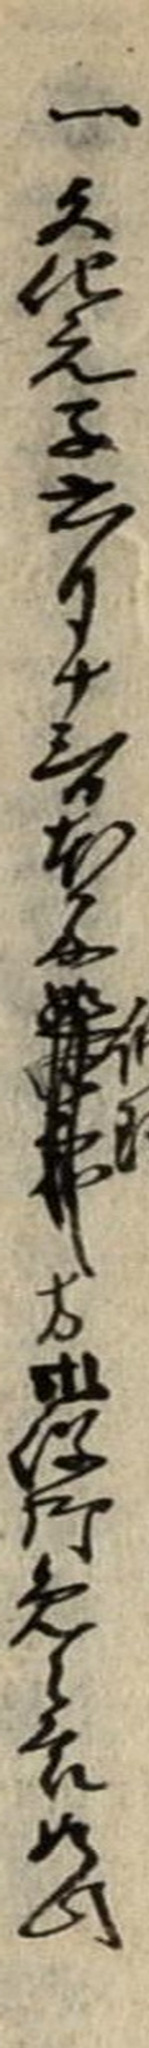一文化元子六月十三日本多修理方御役御免之節如此
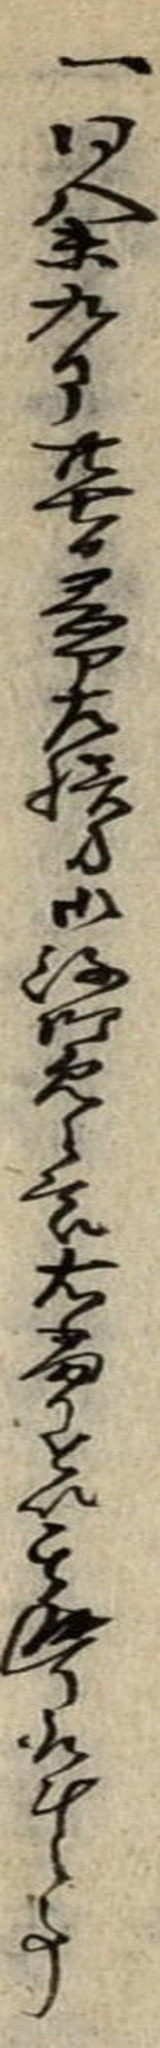一同八未九月廿七日岡部左膳方御役御免之節右当りを以其通り取斗候事
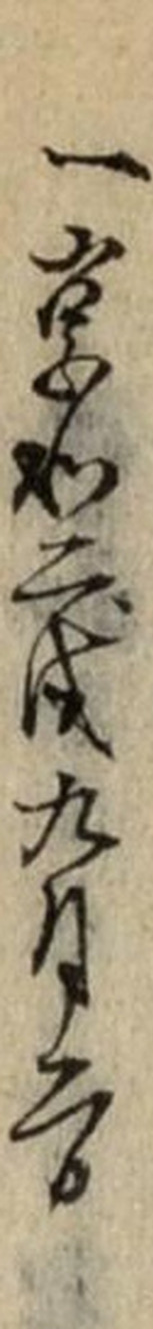一享和二戌九月二日
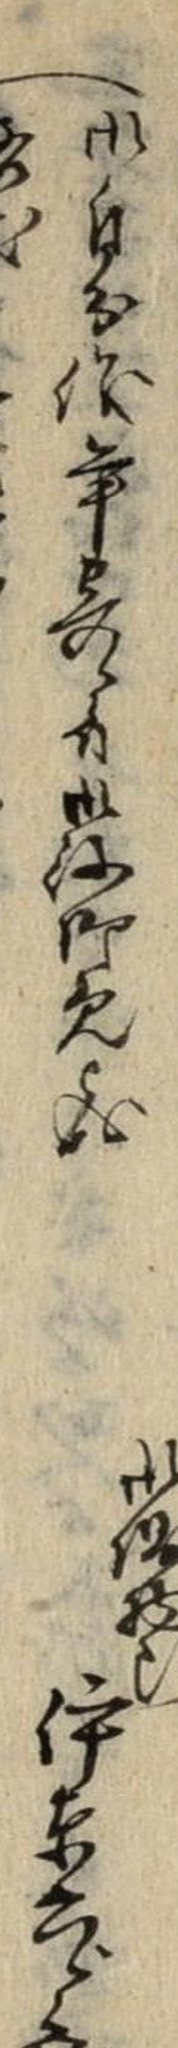御自分儀年寄候に付御役御免被成御側物頭
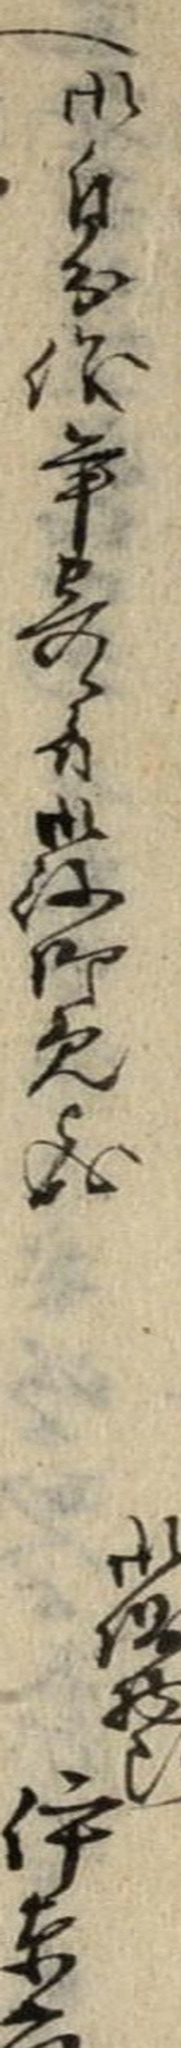御自分儀年寄候に付御役御免被成御側物頭
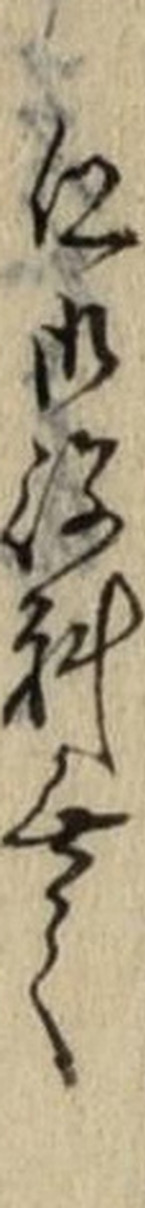但御役料無之
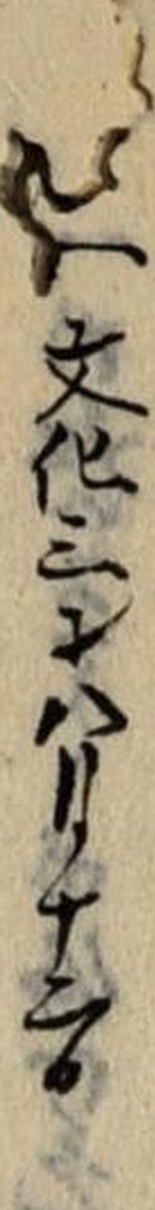一文化三寅八月十二日
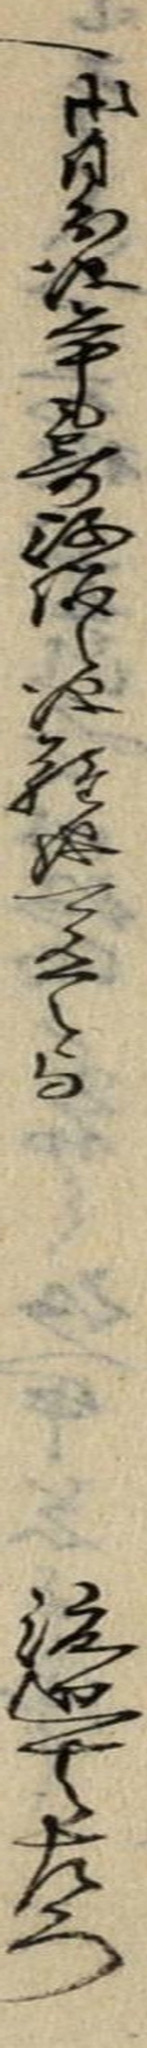御自分儀年も寄役儀之儀難儀可有之候間渡辺十郎左衛門
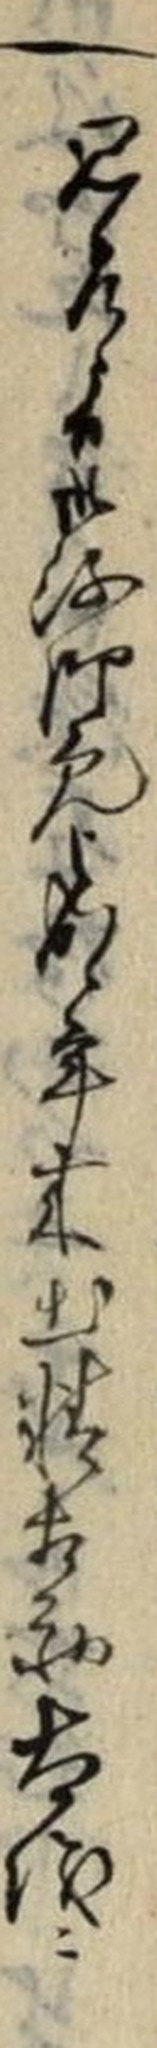思召に付御役御免被成候年来出精相勤太儀に
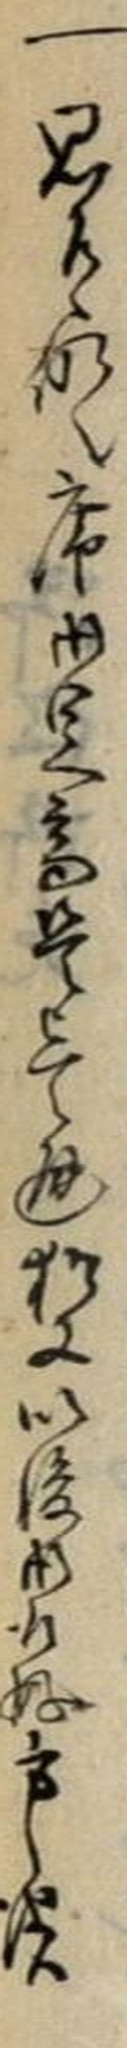思召候仍之席御足高是迄之通猶又以後御取扱方之儀は
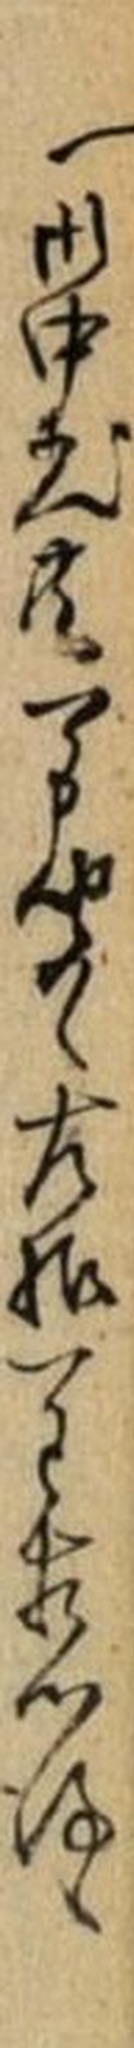御中老共可申聞候左様可被相心得候
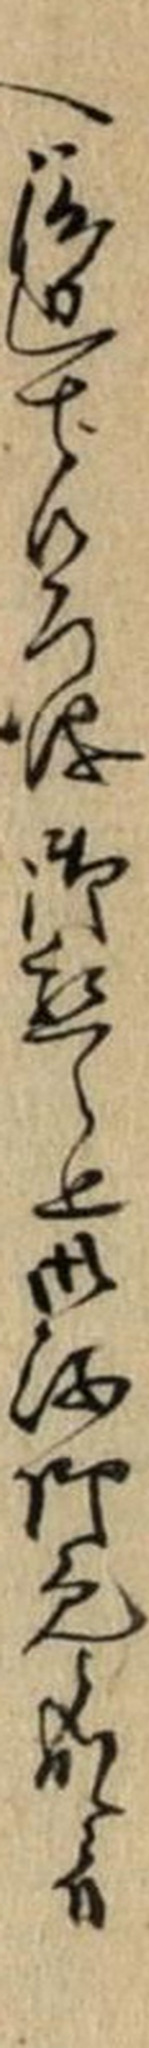渡辺十郎左衛門儀御懇之上御役御免被成候に付
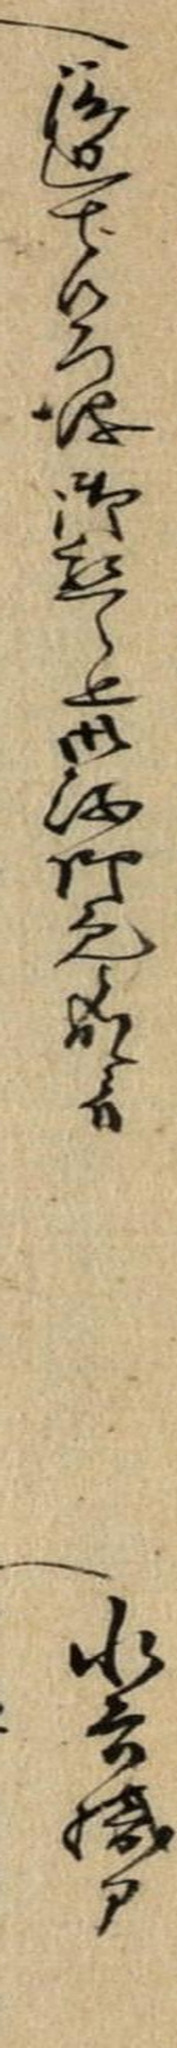渡辺十郎左衛門儀御懇之上御役御免被成候に付
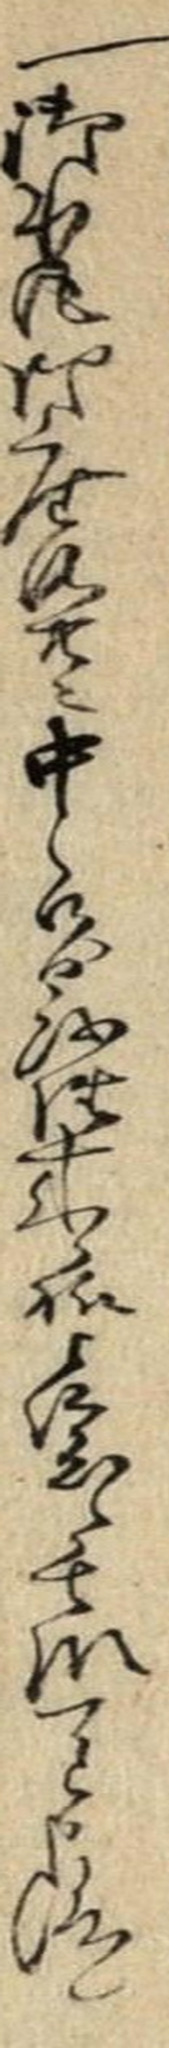御本丸御座所共に中之口ゟ致往来候様被仰出候其段可被申渡候
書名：御用并被仰出之部
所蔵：福井県文書館 Fukui Prefectural Archives
